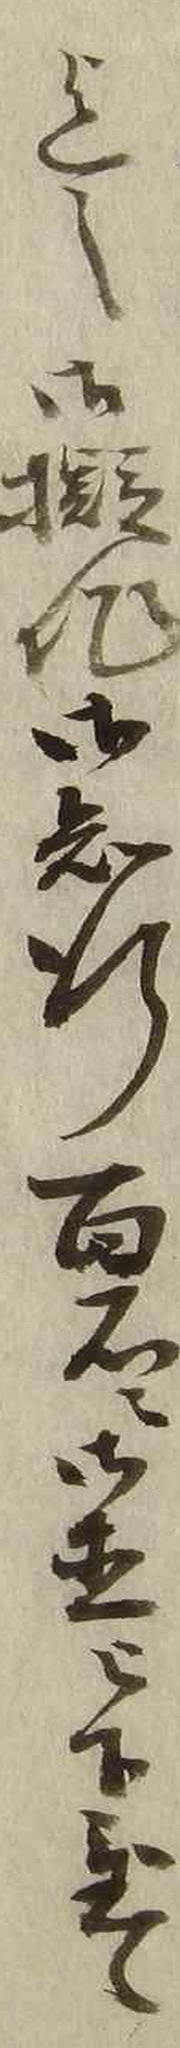迄之御擬作御知行百石ニ御直被下置候
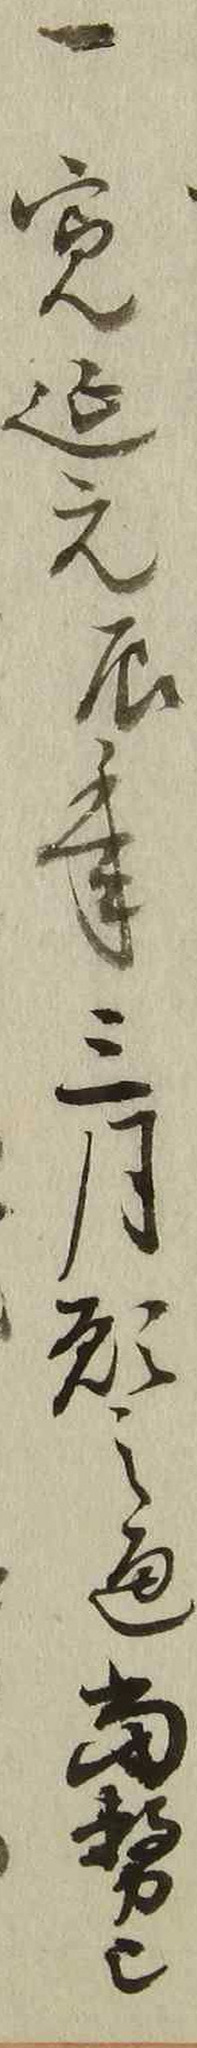一寛延元辰年三月願之通当務被
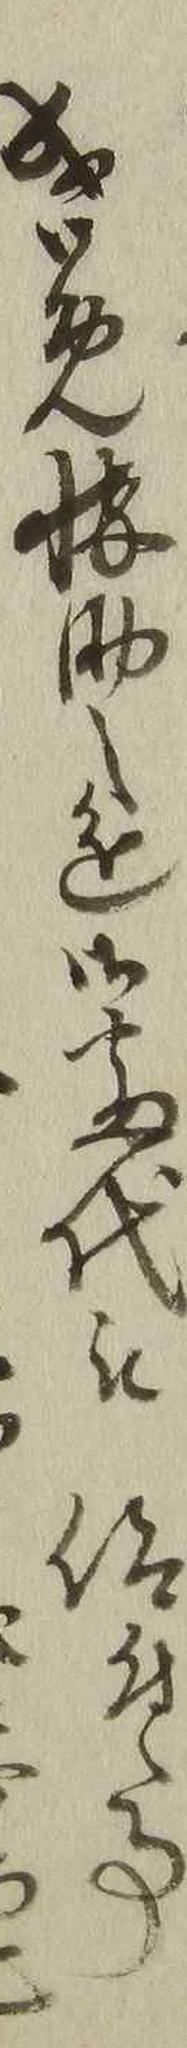成御免忰助之進御番代被仰付候事
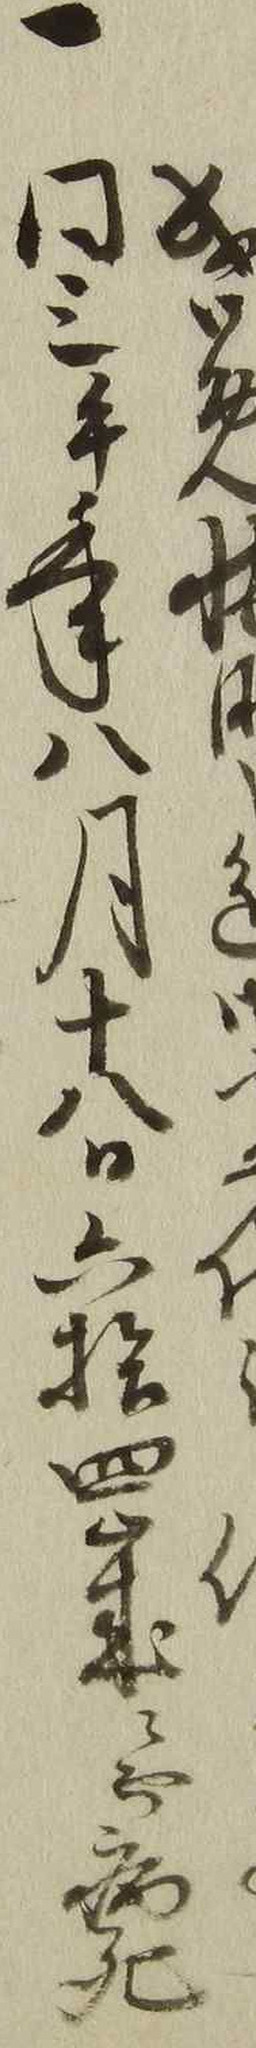一同三午年八月十八日六拾四歳ニ而病死
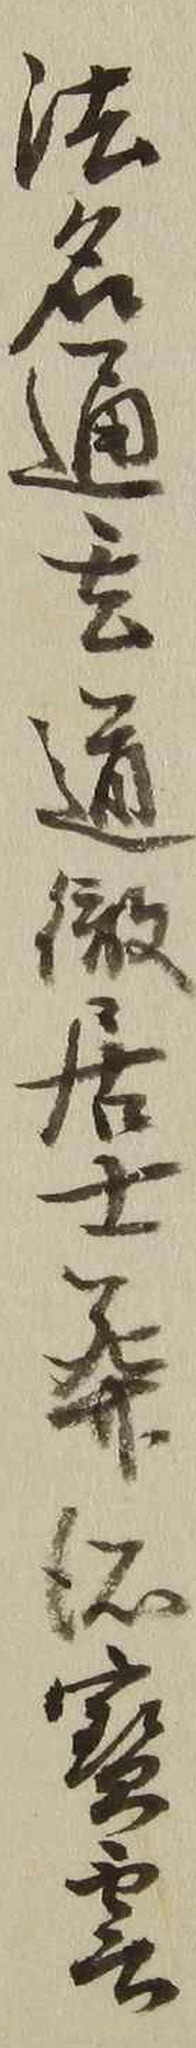法名通玄通徹居士葬所宝雲
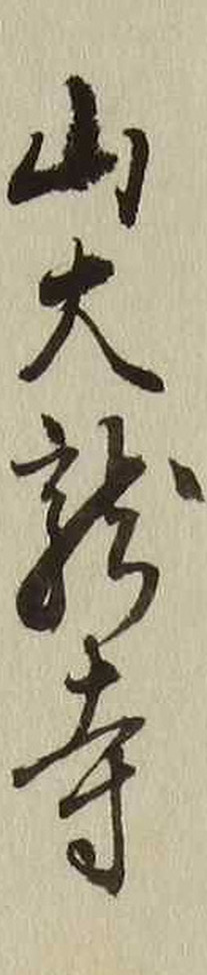山大龍寺
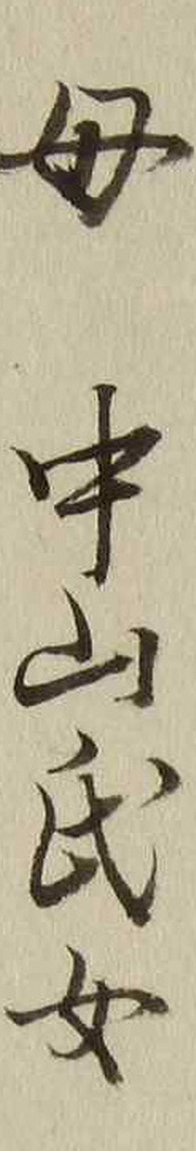母中山氏女
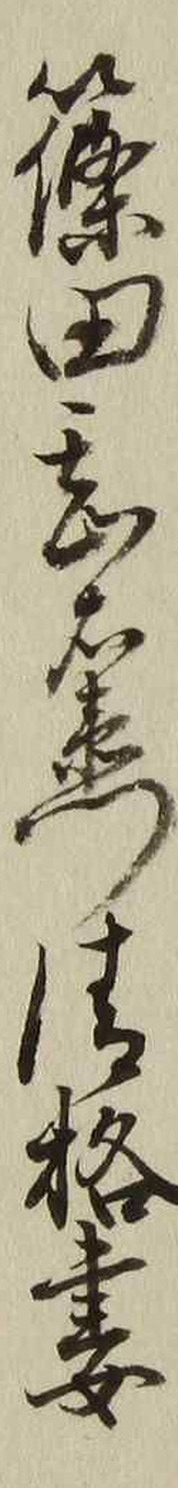女篠田甚右衛門清格妻
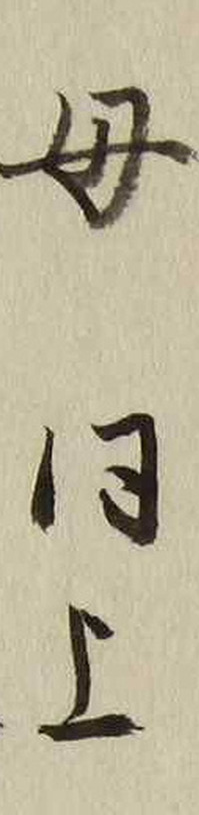母同上
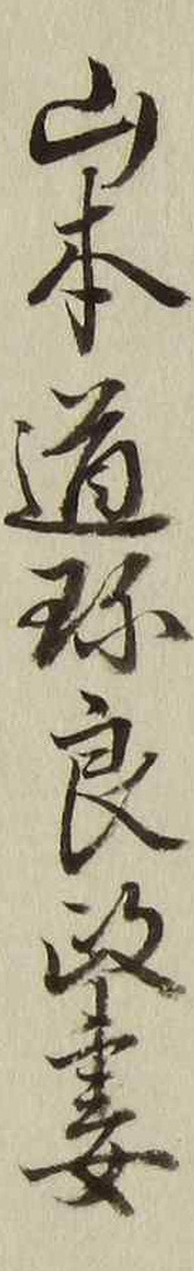女山本道珍良政妻
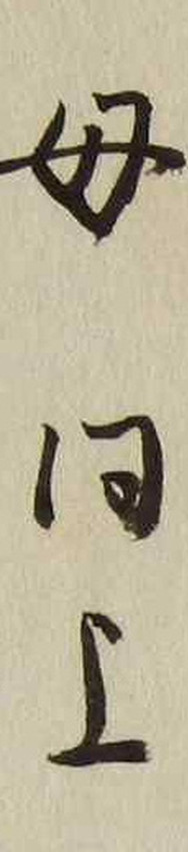母同上
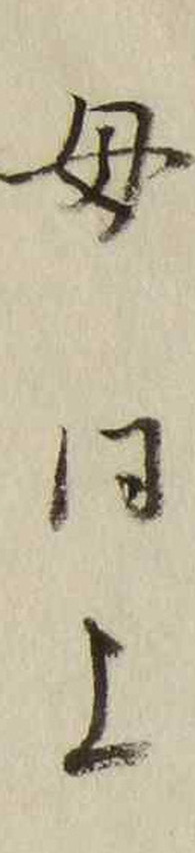母同上

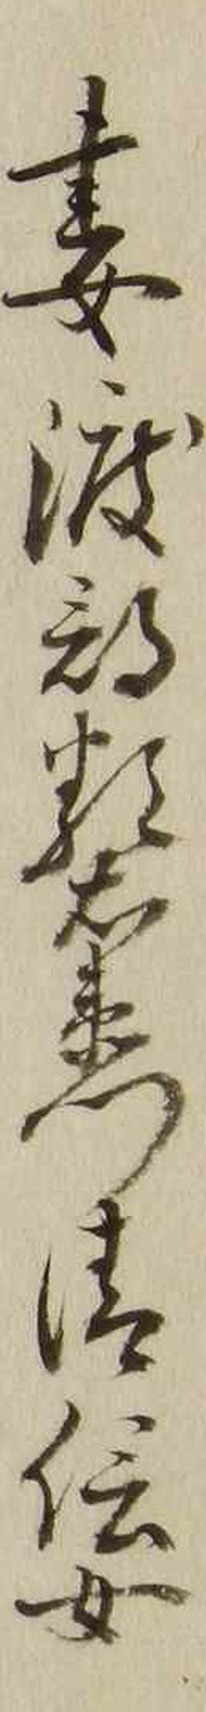妻渡部類右衛門清信女
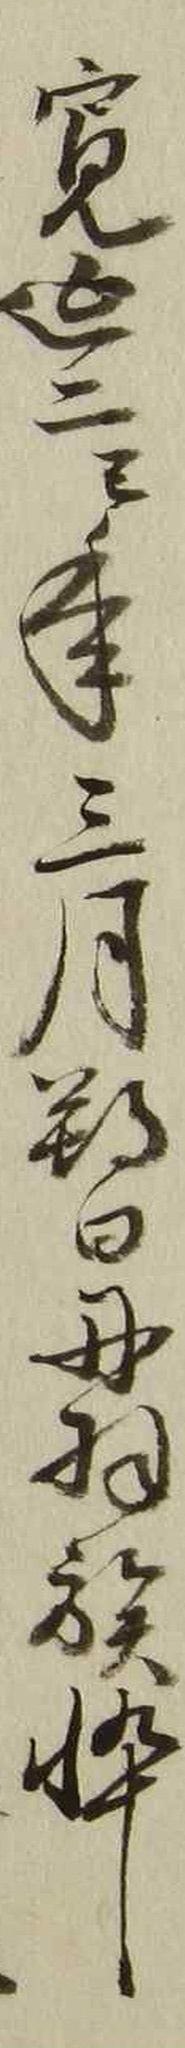寛延二巳年三月朔日丹羽族忰
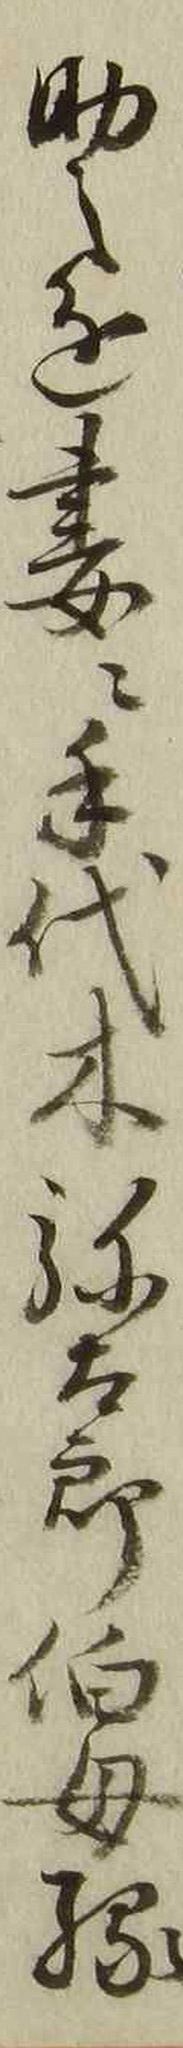助之進妻ニ手代木弥太郎伯母縁
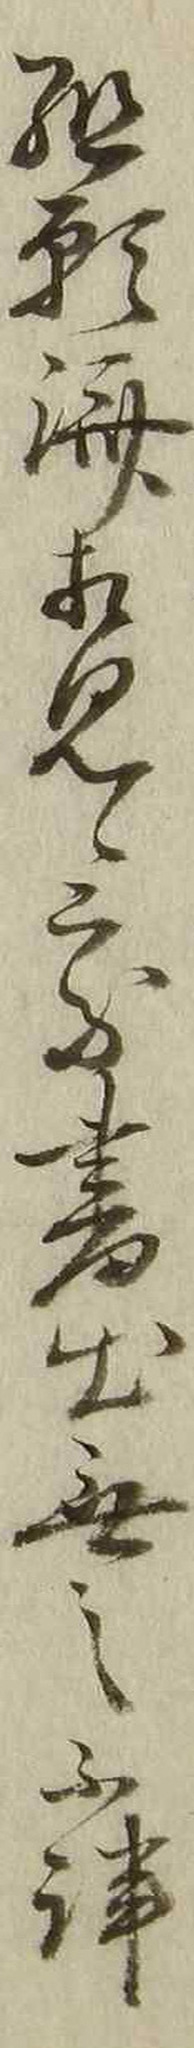組願済相見候処書出無之不詳
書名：諸士系譜　巻之53　に之部4
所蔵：会津若松市立会津図書館
